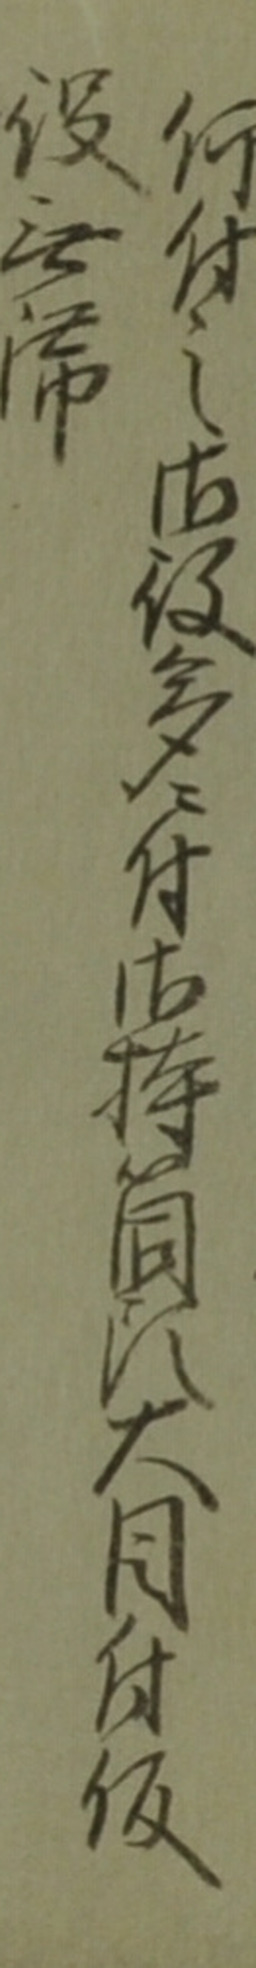仰付之御役多ニ付御持筒頭大目付仮
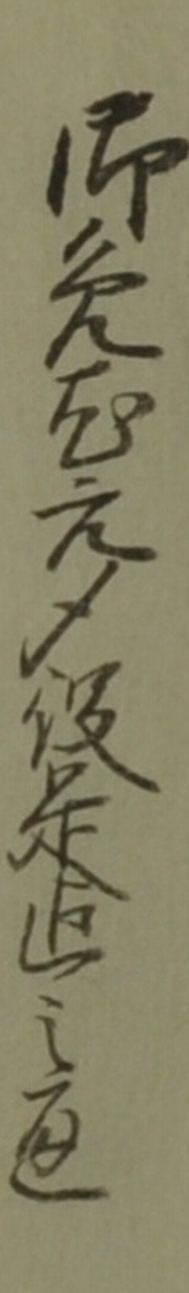御免尤元〆役是迄之通
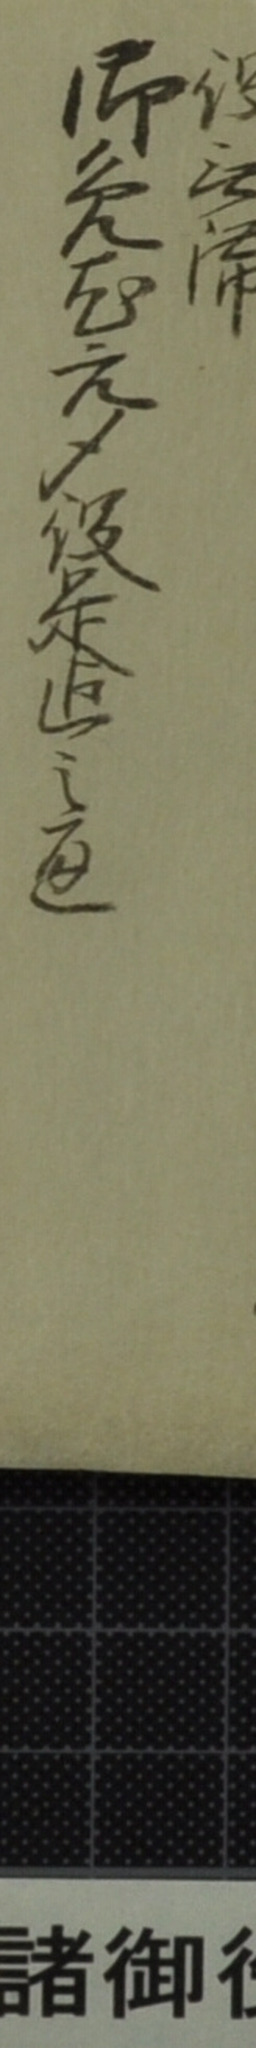御免尤元〆役是迄之通
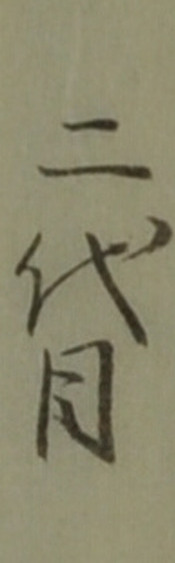二代目
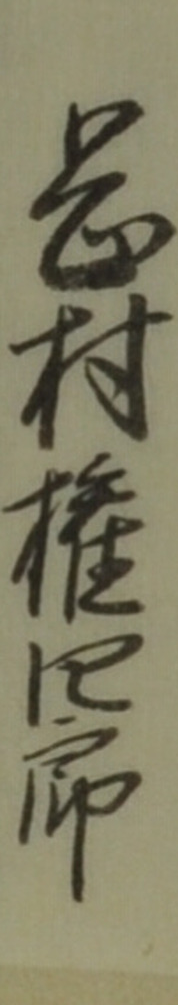岡村権四郎
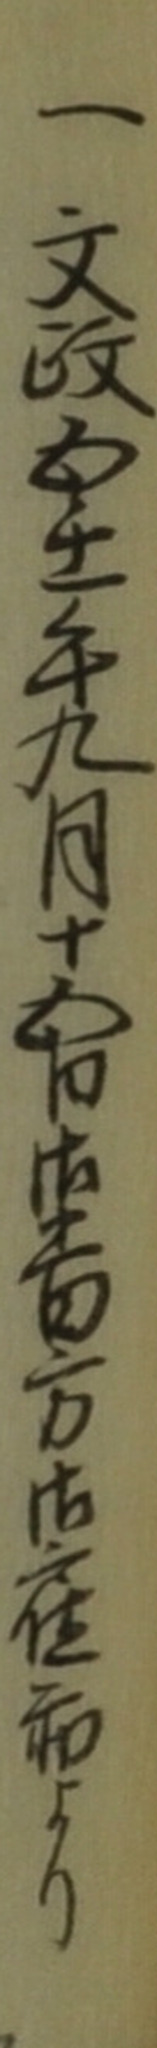一文政五壬午九月十五日御番方御雇勤より
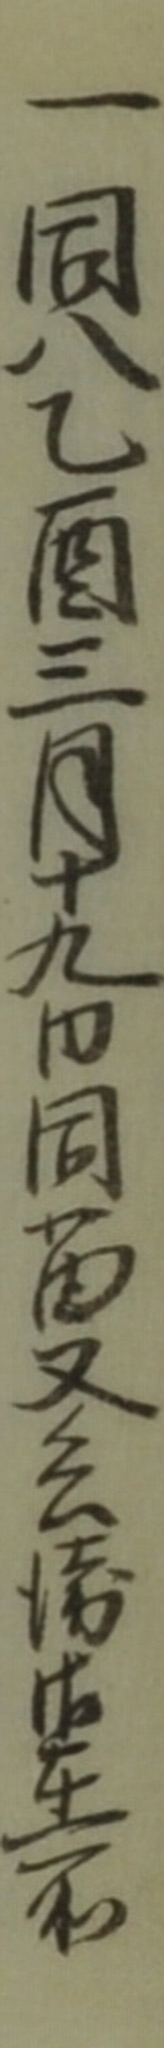一同八乙酉三月十九日同苗又兵衛御在所
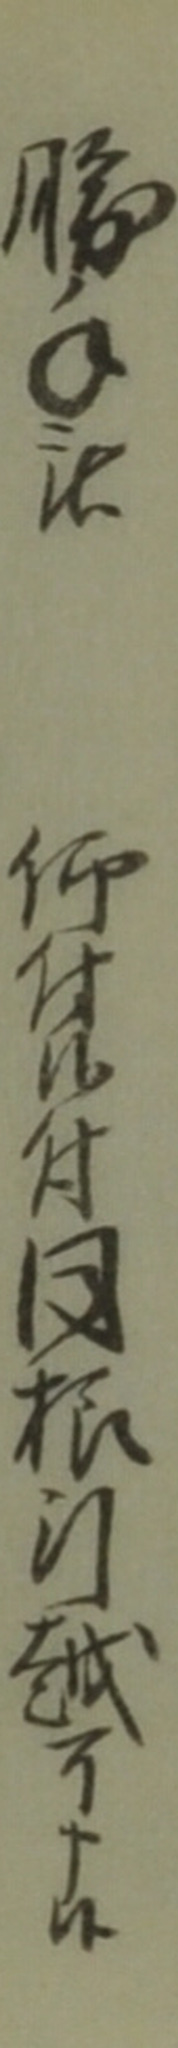勝手被仰付候付同様引越可申候
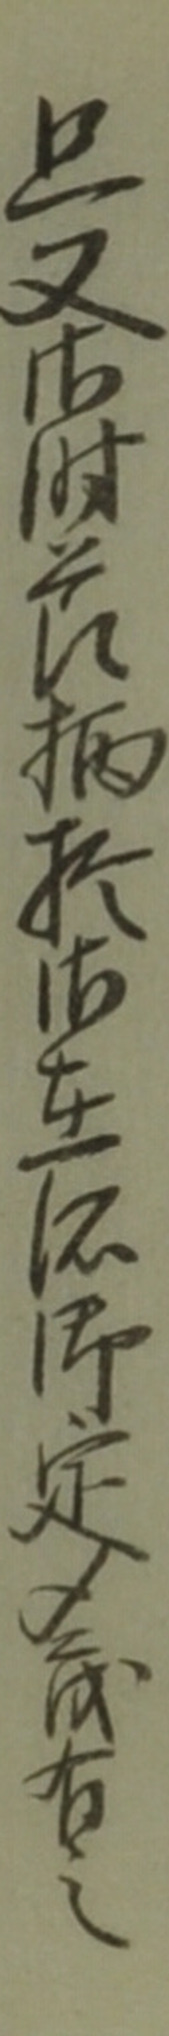且又御附節柄於御在所御定メ茂有之
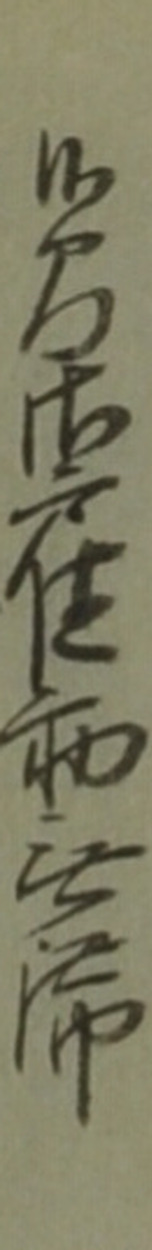候間御雇勤無滞
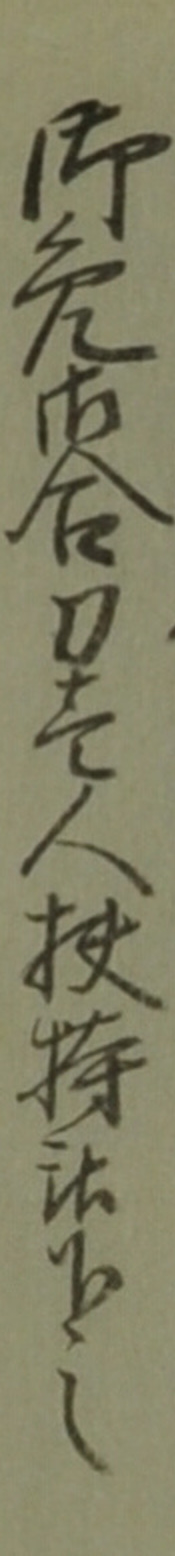御免御合力壱人扶持被下之
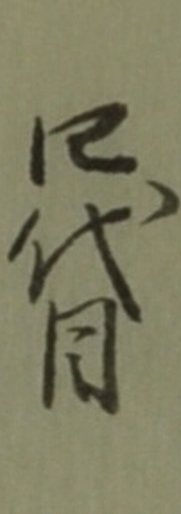四代目
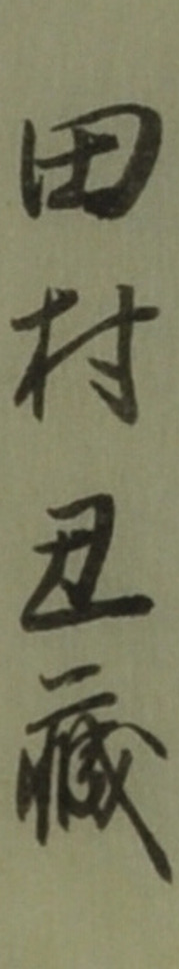田村丑蔵
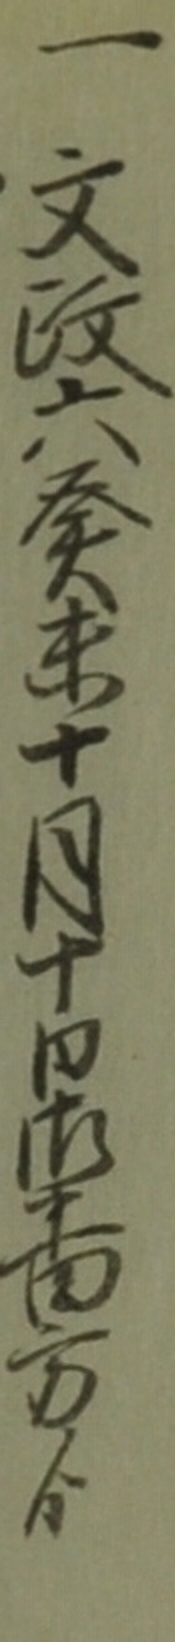一文政六癸未十月十日御番方ゟ
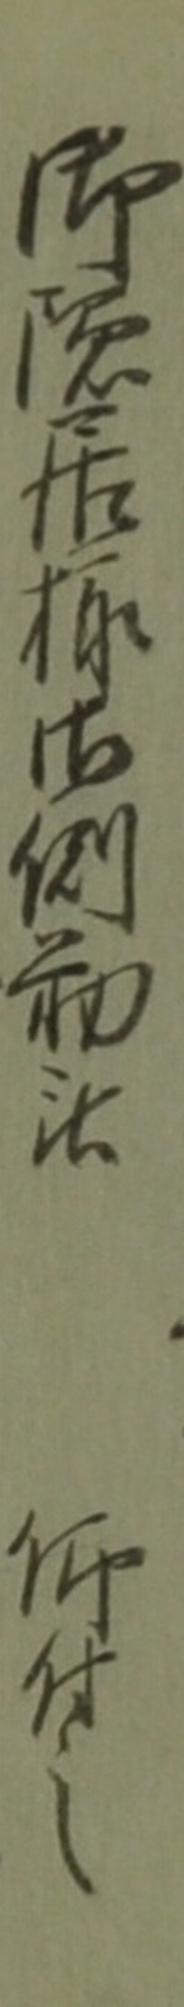御隠居様御側勤被仰付之
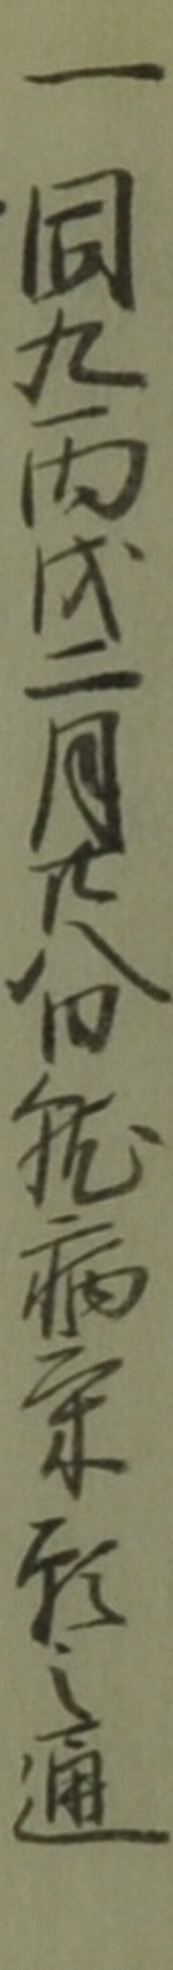一同九丙戌二月廿八日就病気願之通
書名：諸御役代々録（五）
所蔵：伊那市立高遠町図書館・合同会社AMANE
